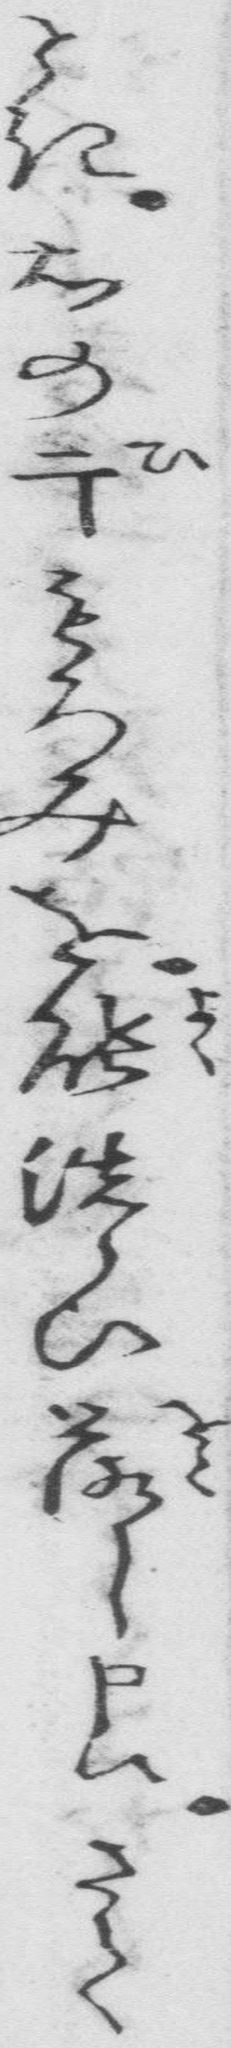とき。右の干もろみを。能洗らひ落し申候。さて
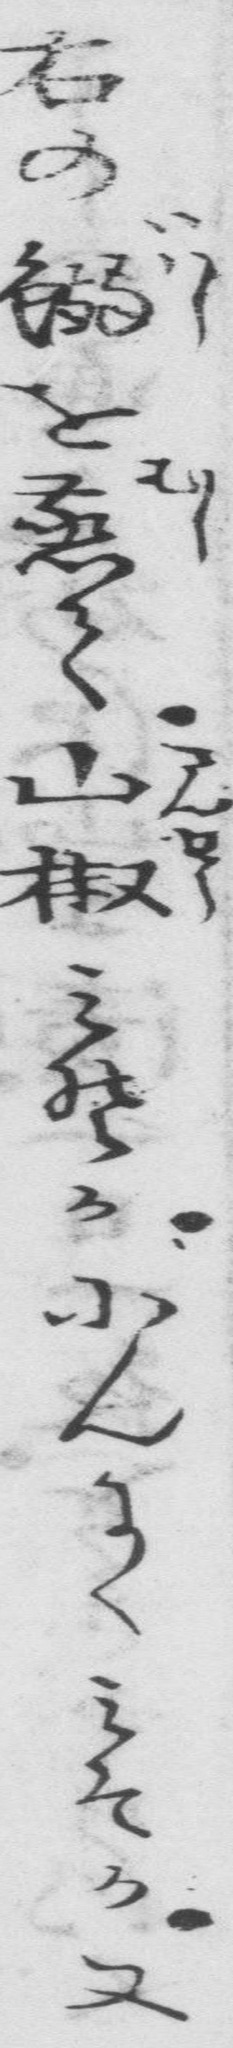右の鰯を蒸て。山椒みそか。にんにくみそか。又
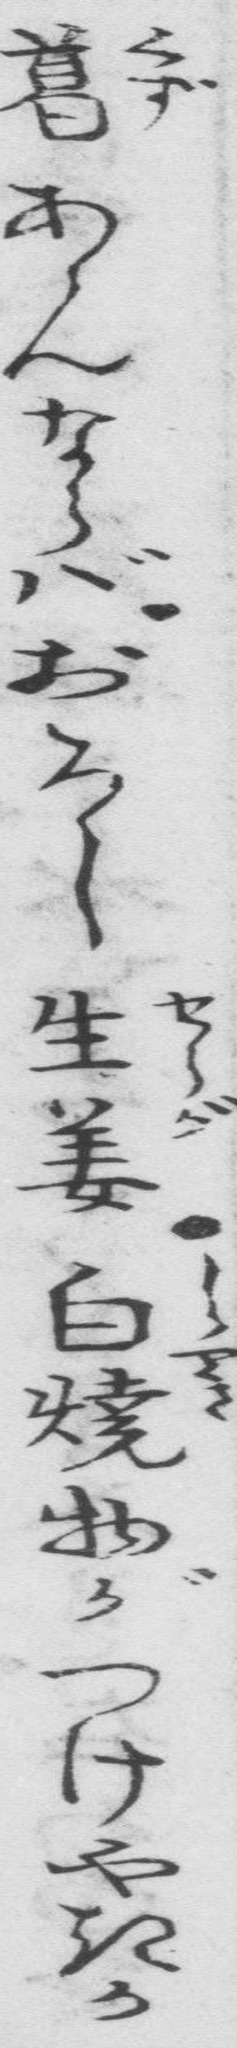葛あんならば。おろし生姜。白焼物かつけやきか
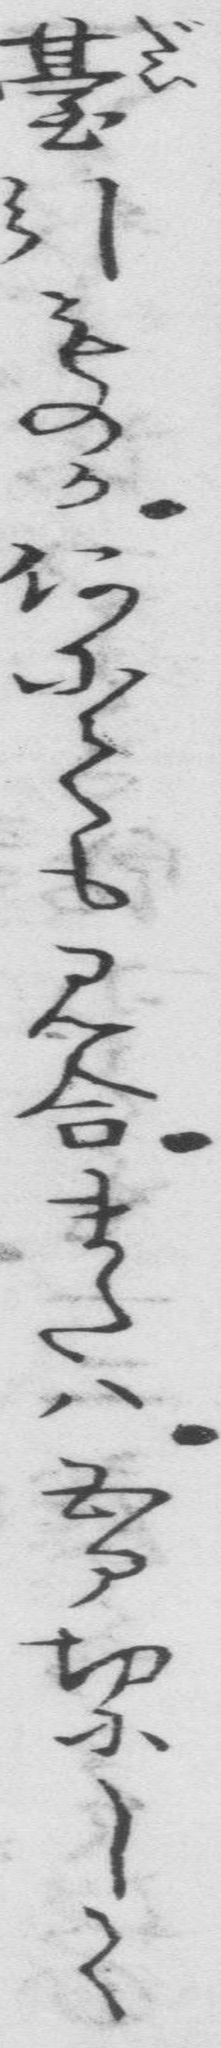台引ものか。何にても見合。または。五分切にして
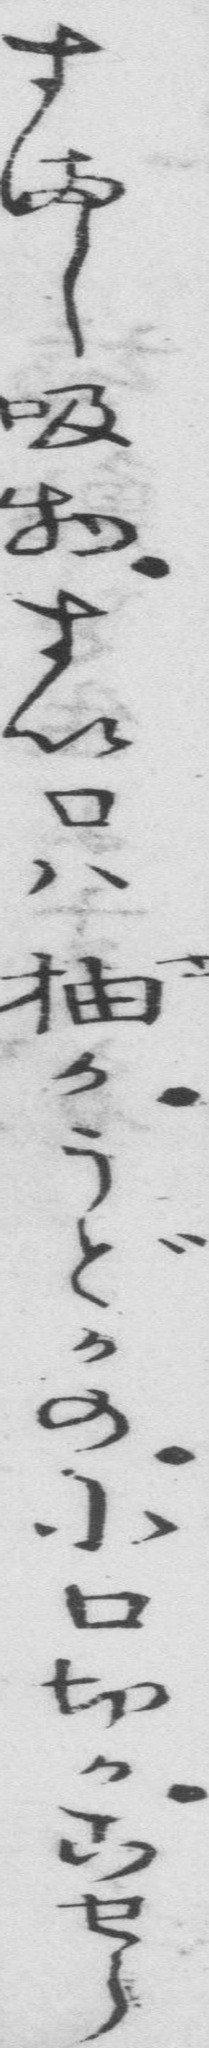すまし吸物。すい口は柚か。うどかの。小口切か。こせう

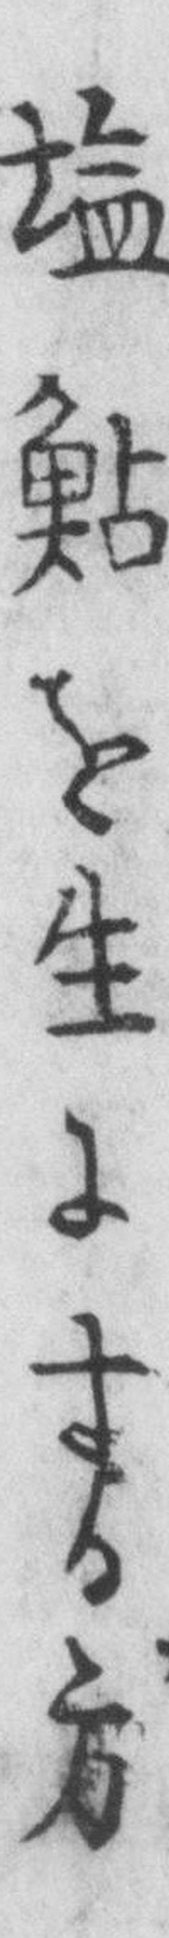塩鮎を生にする方
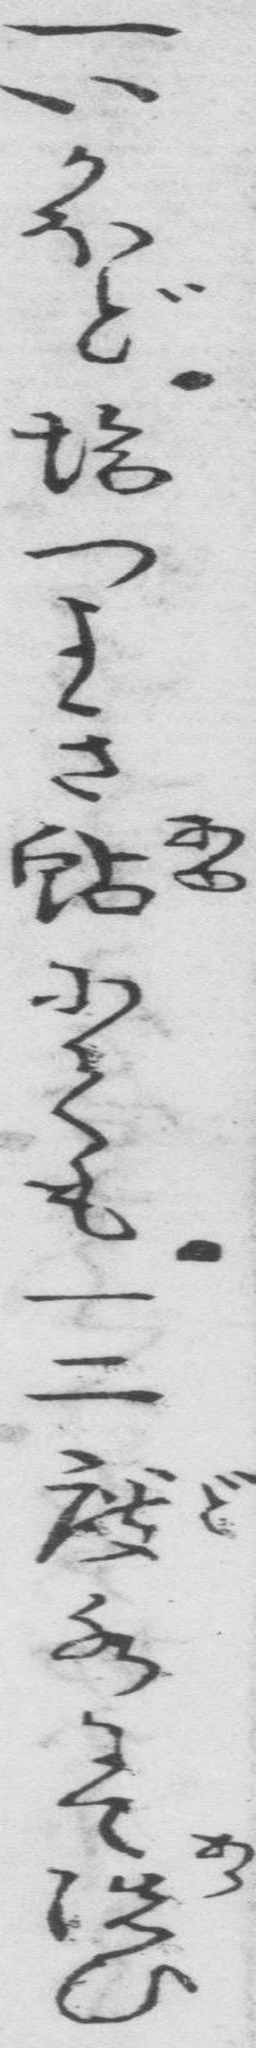一いかほど。塩つよき鮎にても。一二度水にて洗ひ
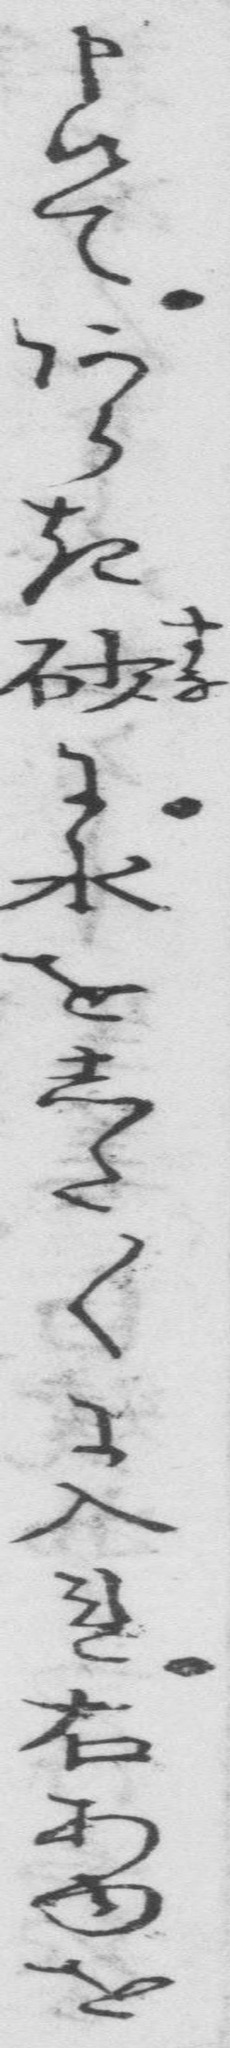申候て。あらき砂に。水をした〳〵に入れ。右あゆを
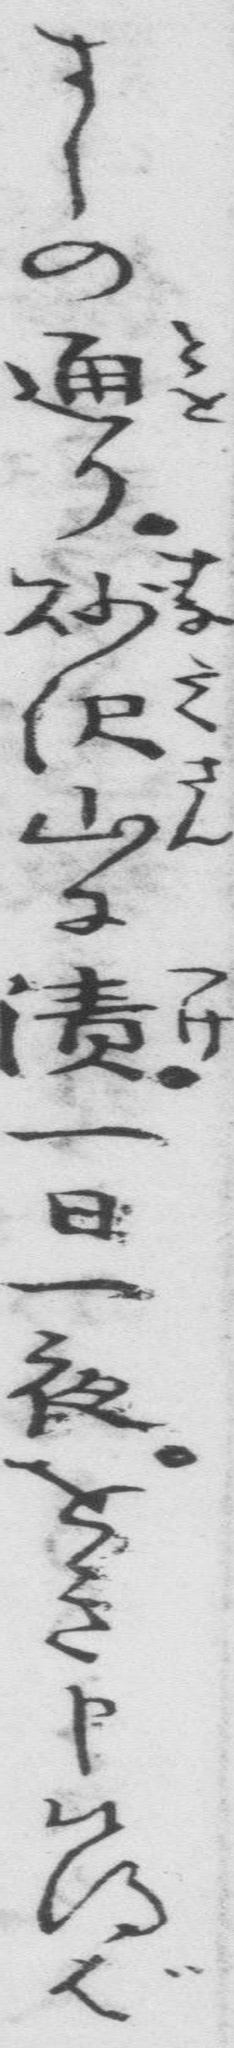すしの通り。砂沢山に漬。一日一夜。をき申候得ば
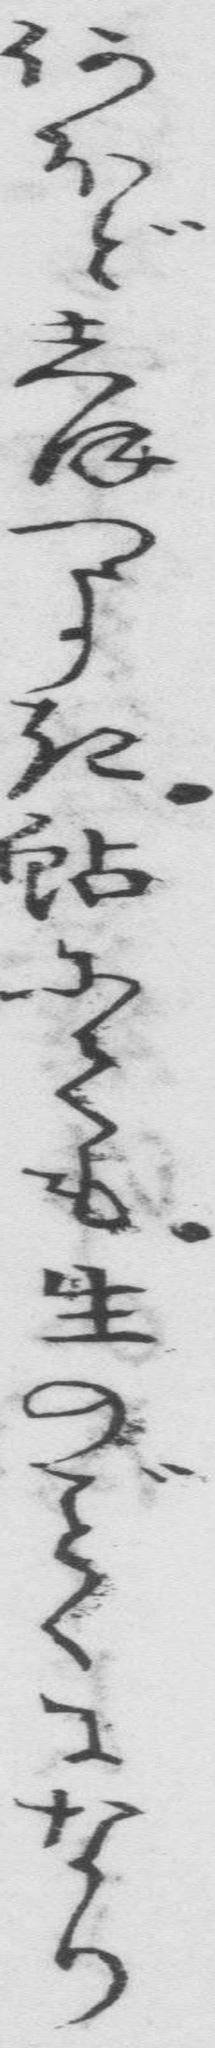何ほどしほつよき。鮎にても。生のごとくになり
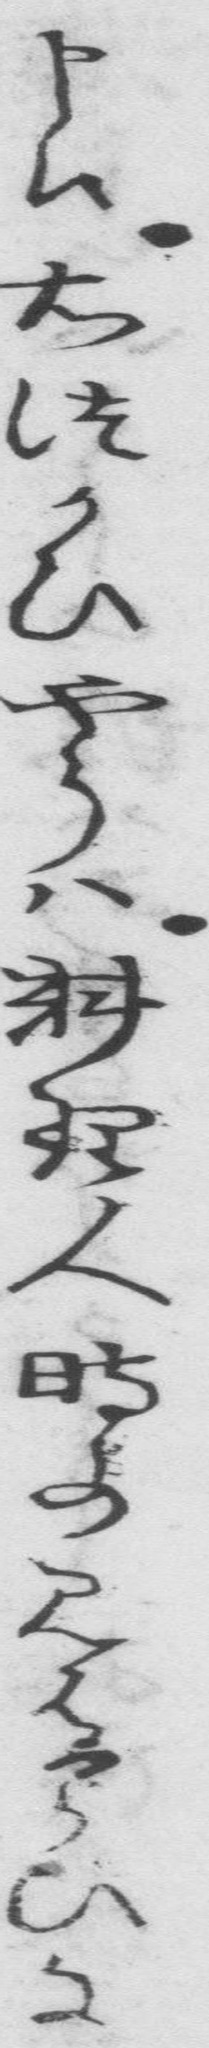申候。右つかひやうは。料理人時の見はからひに
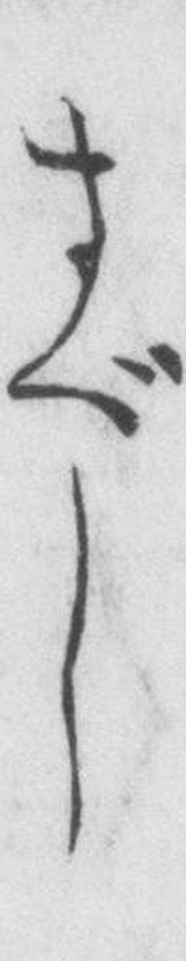すべし
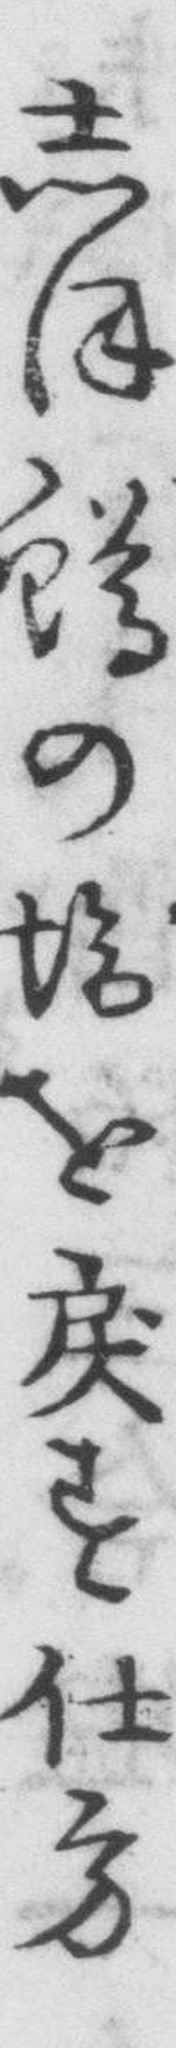しほ鱒の塩を戻す仕方
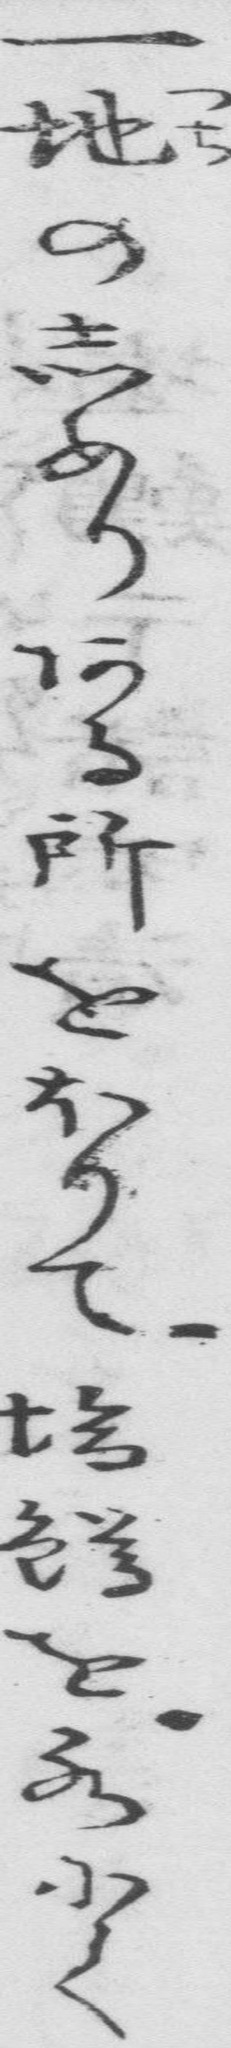一地のしめりある所をほりて。塩鱒を。水少く
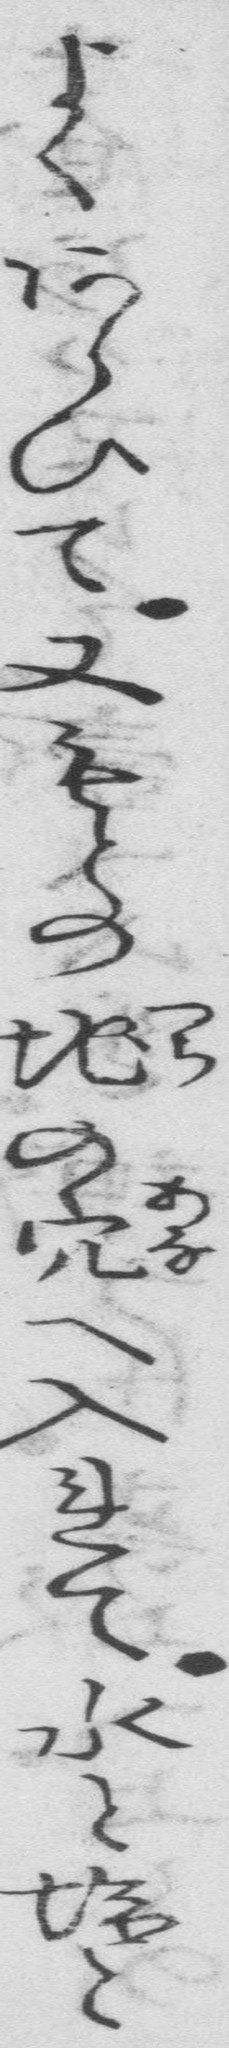よくあらひて。又もとの地の穴へ入れて。水と塩と
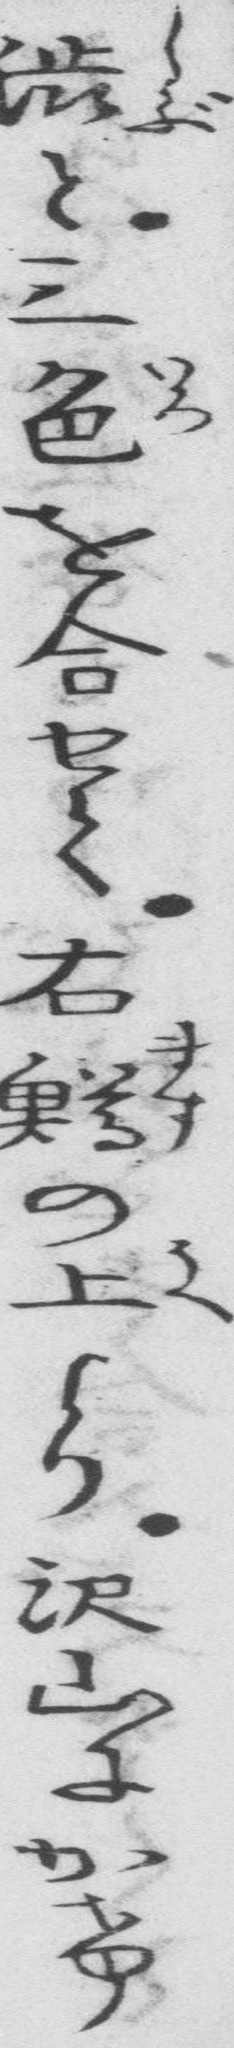渋と。三色を合せて。右鱒の上より。沢山にかけ
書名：萬寳料理秘密箱
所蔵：大阪府立大学学術情報センター 国文学研究資料館
